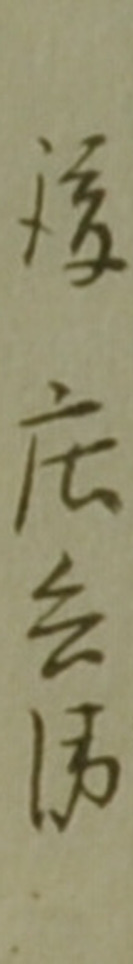後庄兵衛
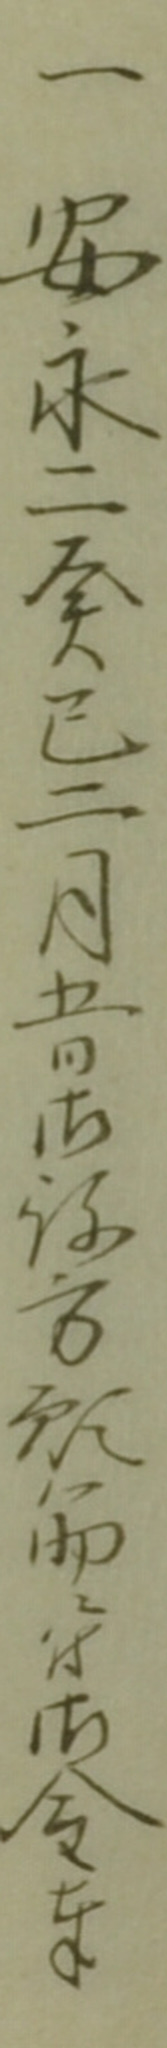一安永二癸巳二月五日御役方願筋ニ付御金奉
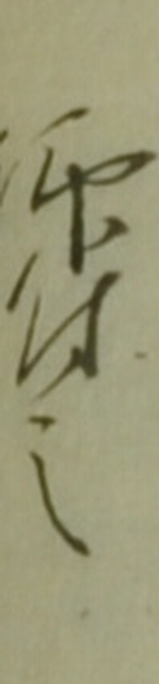仰付之
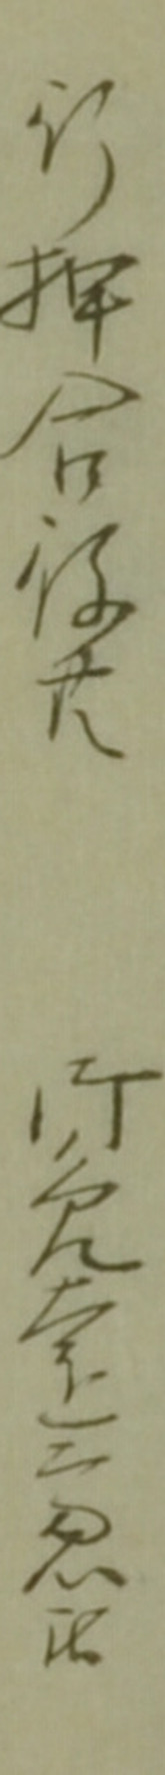行押合役共御免遠慮被
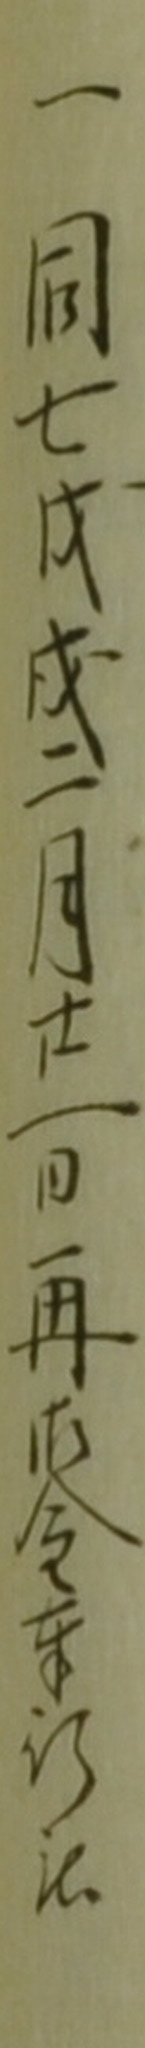一同七戊戌二月廿一日再御金奉行被
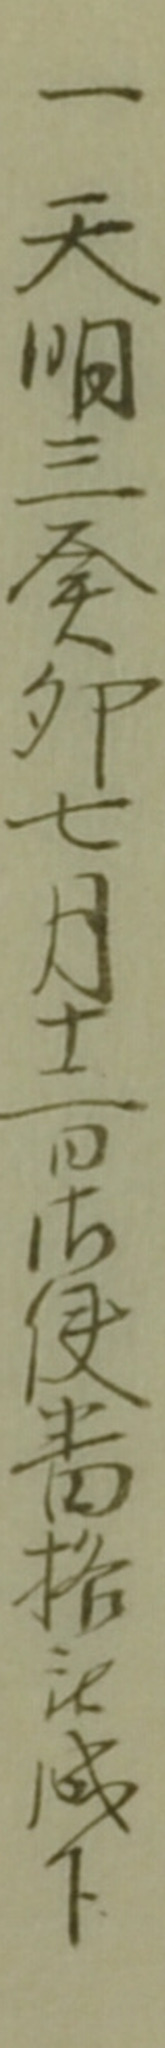一天明三癸卯七月十二日御使番格被成下
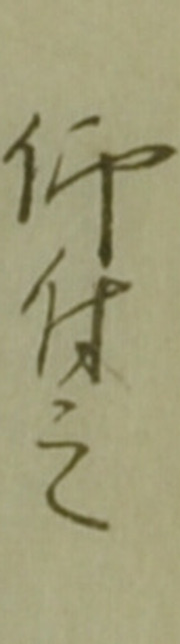仰付之
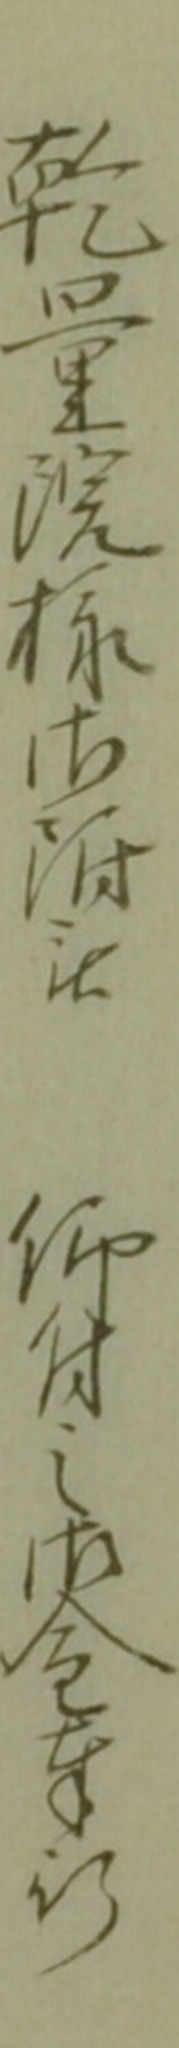乾量院様御附被仰付之御金奉行
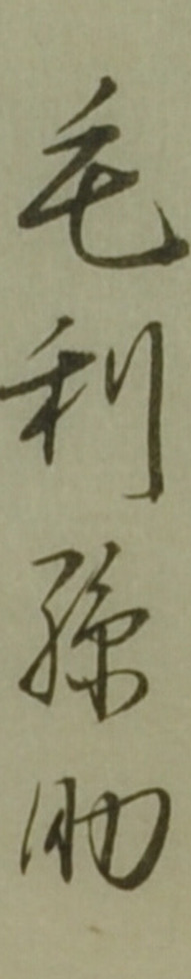毛利孫助
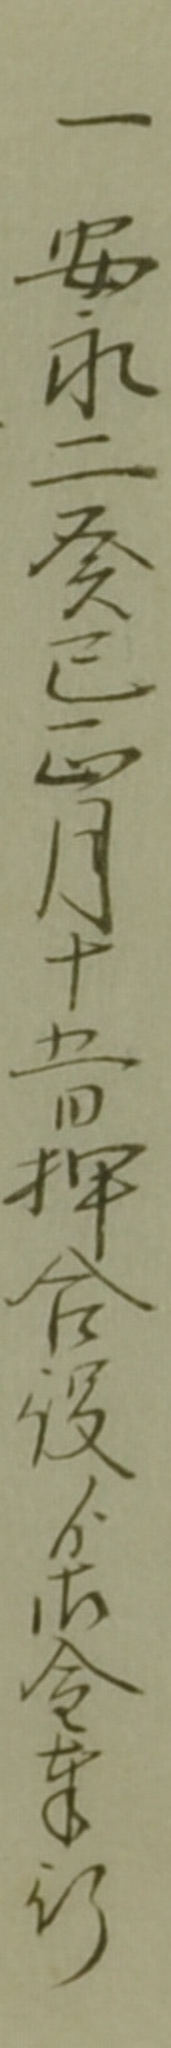一安永二癸巳正月十五日押合役ゟ御金奉行
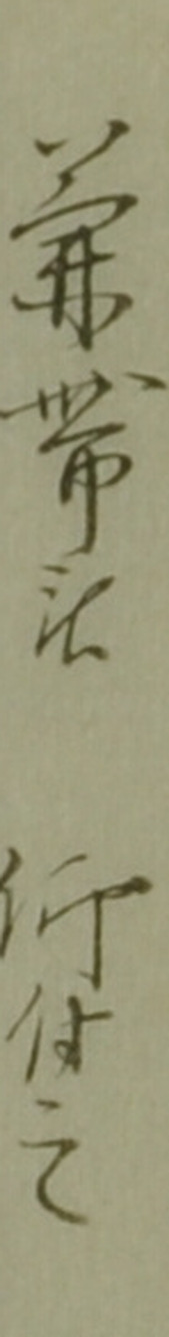兼帯被仰付之
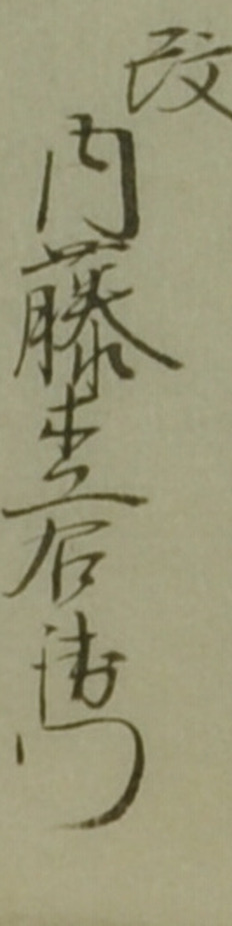内藤杢右衛門
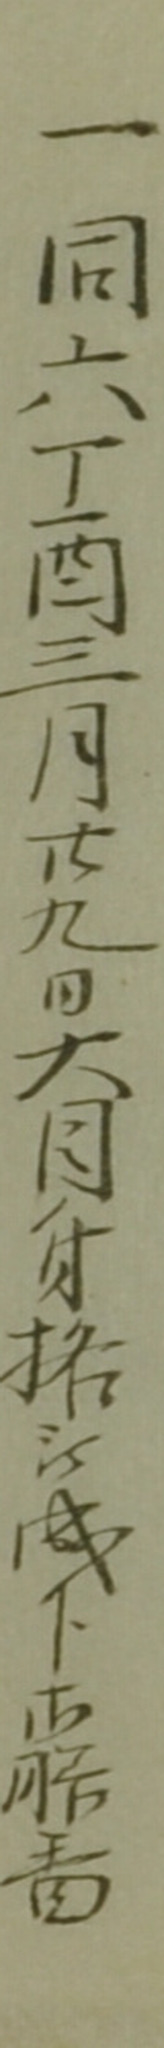一同六丁酉三月廿九日大目付格被成下御膳番
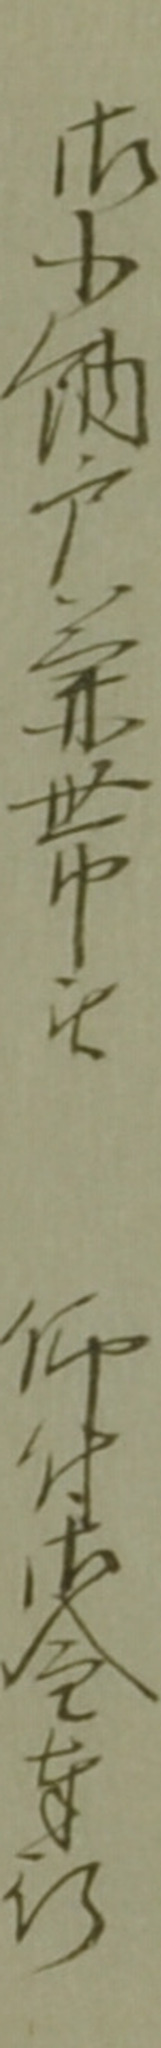御小納戸兼帯被仰付御金奉行
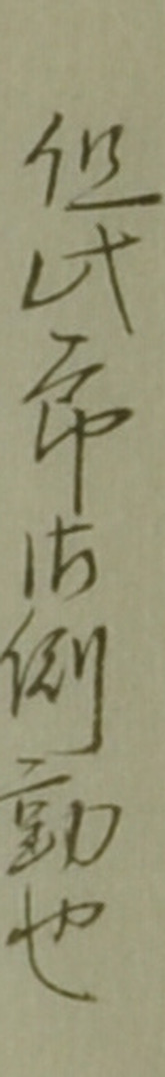但此節御側勤也
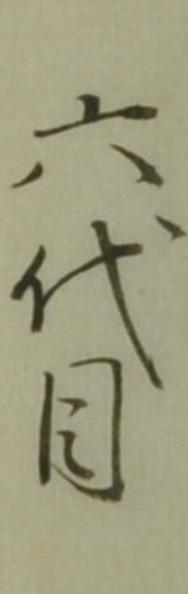六代目
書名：諸御役代々録（七）
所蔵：伊那市立高遠町図書館・合同会社AMANE
